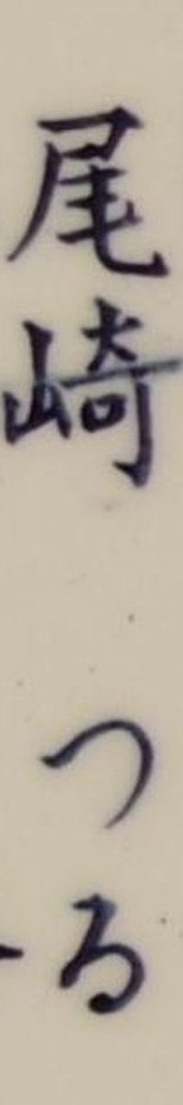尾崎つる
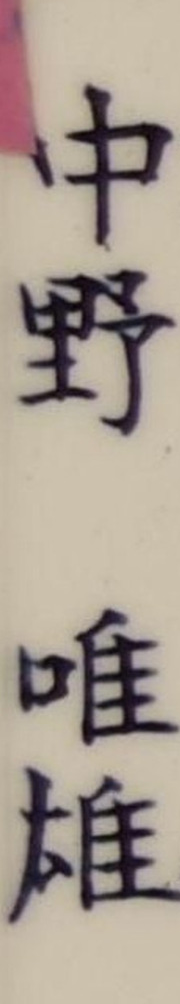中野唯雄

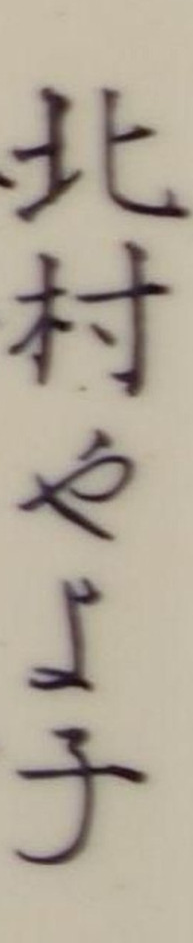北村やよ子
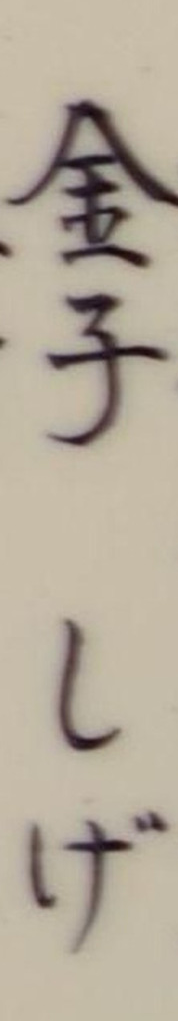金子しげ
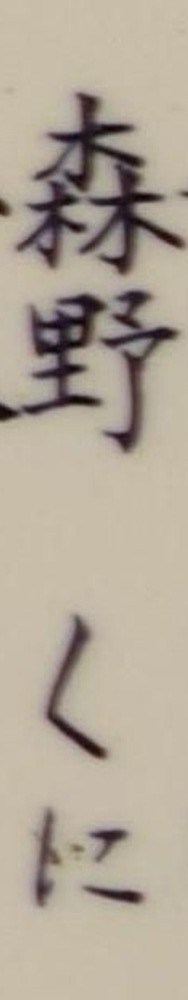森野くに
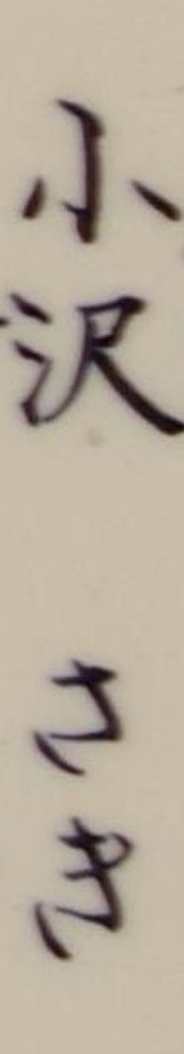小沢さき
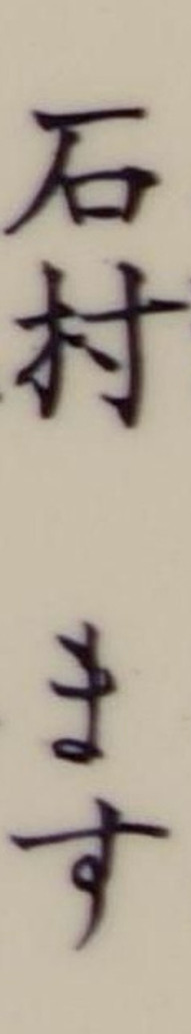石村ます
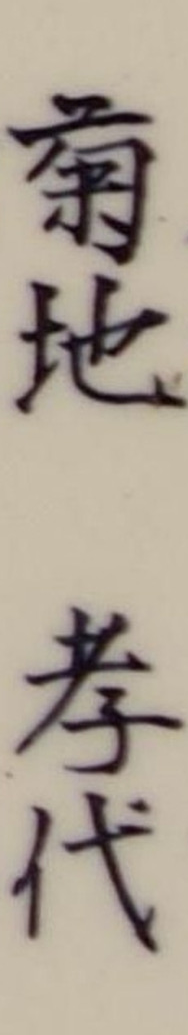菊地孝代
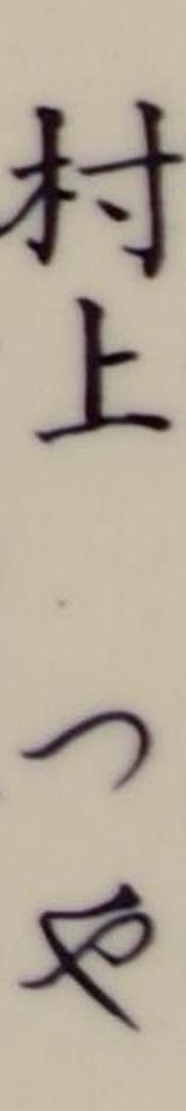村上つや
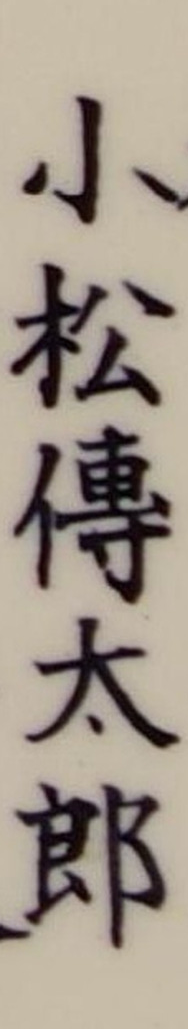小松伝太郎
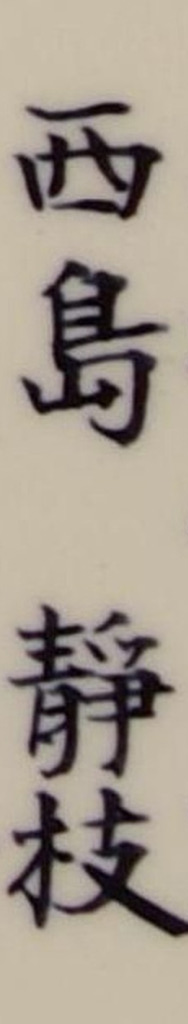西島静枝
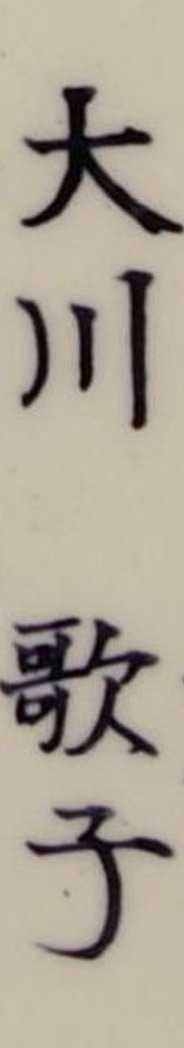大川歌子
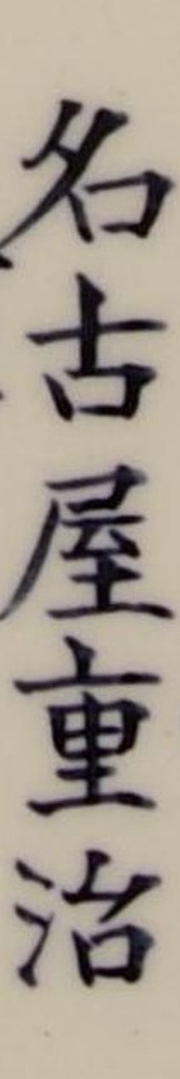名古屋重治
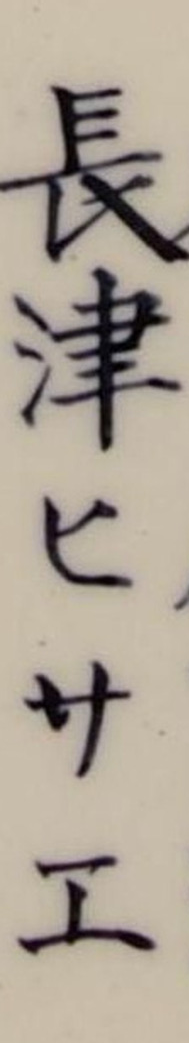長津ヒサエ
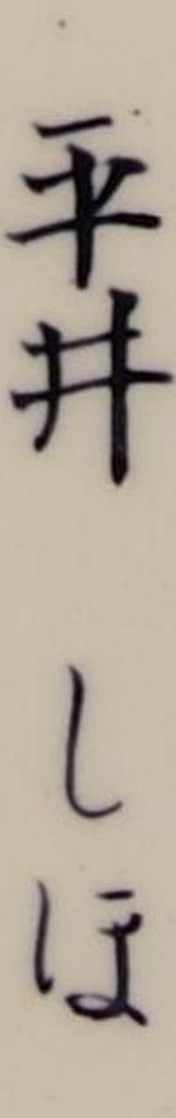平井しほ
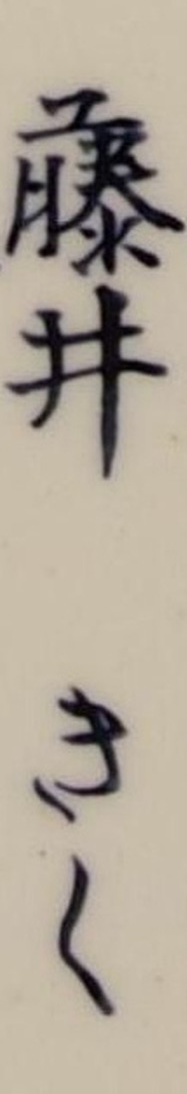藤井きく
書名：E~L
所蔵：高野山金剛峯寺
